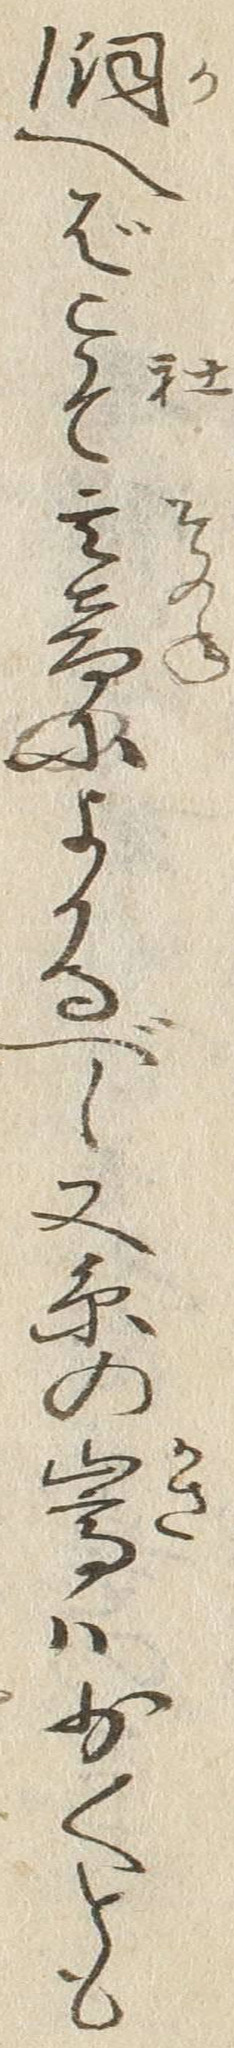飼へばこそ其音尓よかるべし又糸の嵩は少くとも
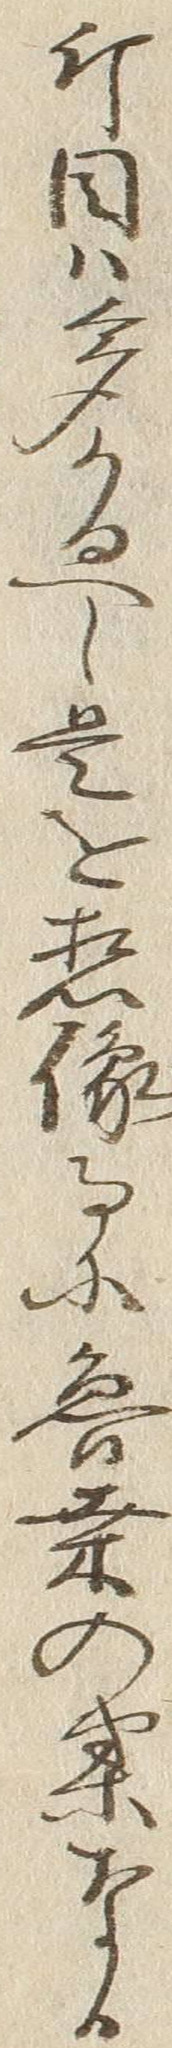斤目は多かるへし是を想像る尓魯桑の柔なる
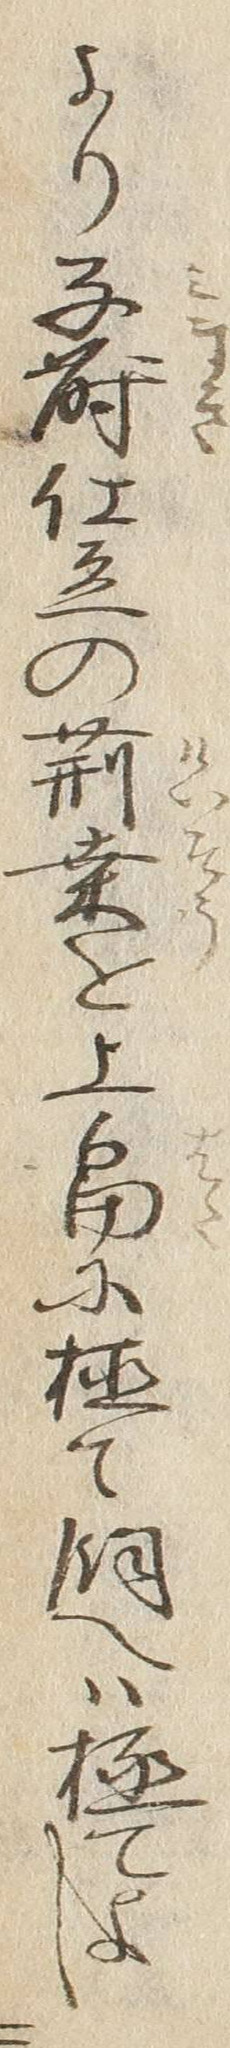より子蒔仕立の荊桑を上畠尓植て飼へは植てよし

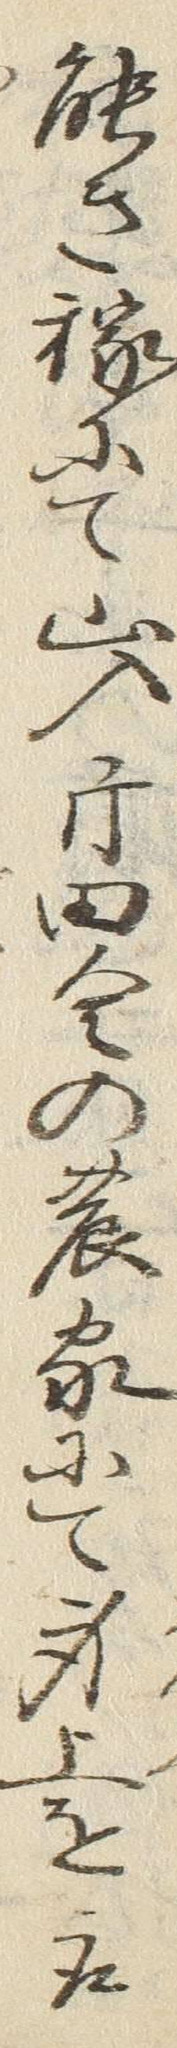能き稼尓て山入片田舎の農家尓て身上を取
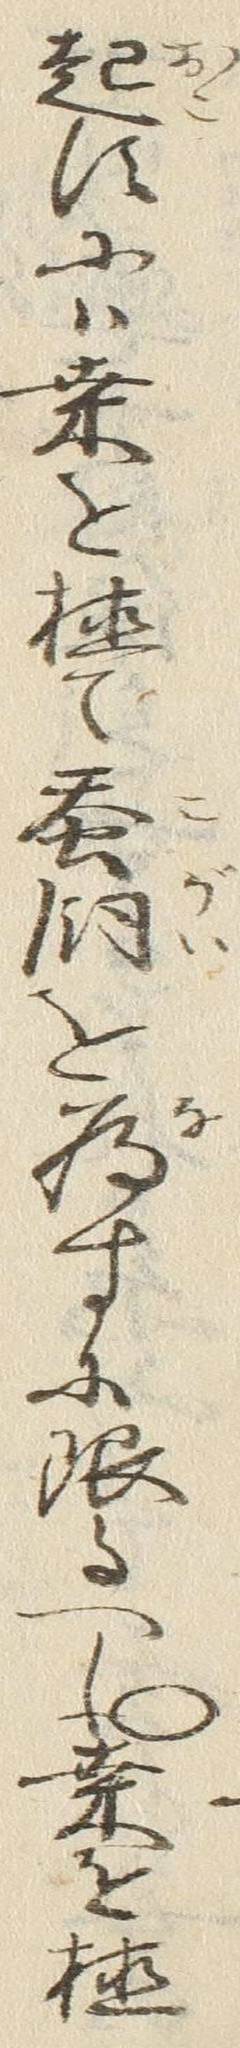起須尓は桑を植て蚕飼を為す尓限るへし〇桑を植
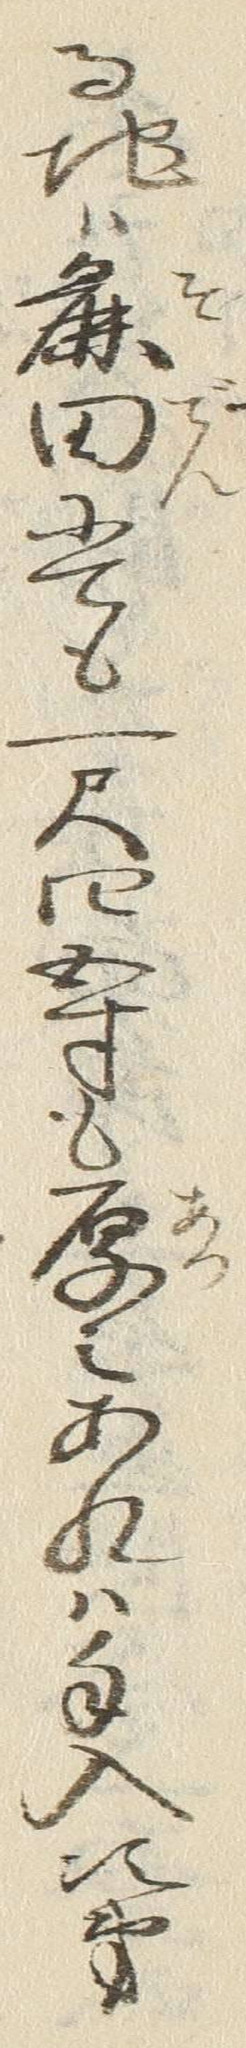る地は麁田尓ても一尺四五寸も厚みあれは手入次第
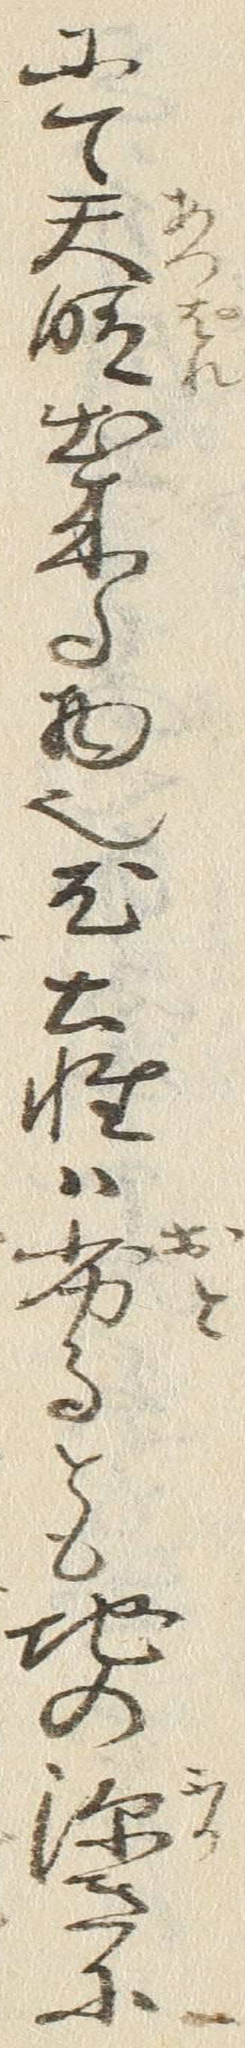尓て天晴出来る物也尤土性は劣るとも地の深き尓
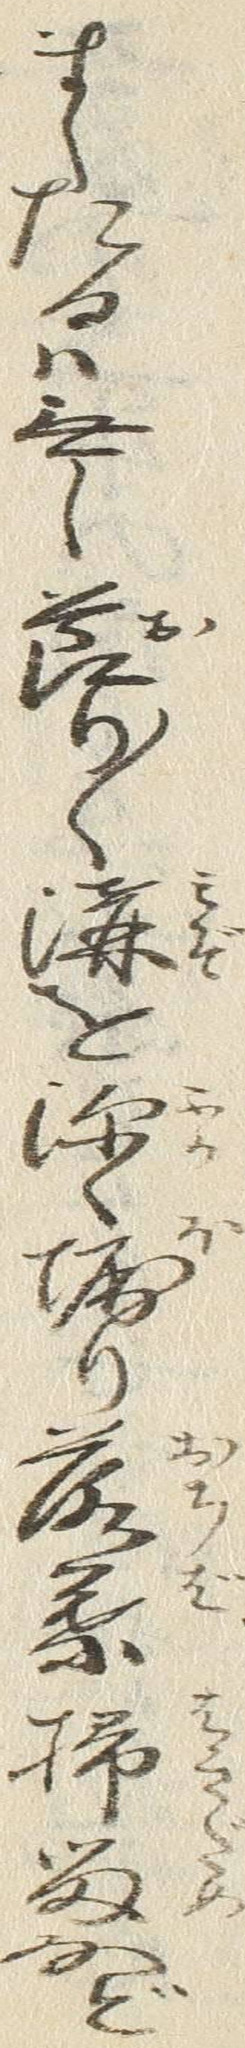ましたるは無し節り〳〵溝を深く堀り落葉掃留など
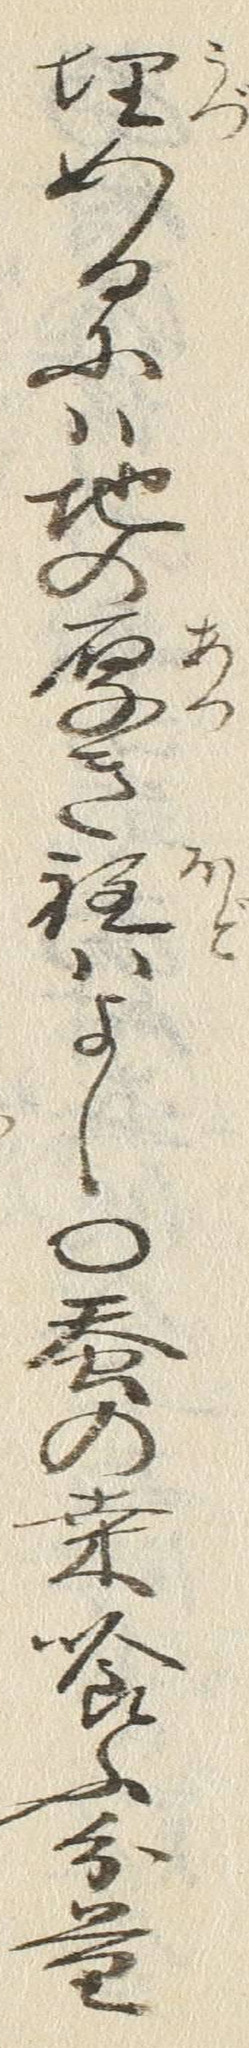埋める尓は地の厚き程はよし〇蚕の桑喰ふ分量
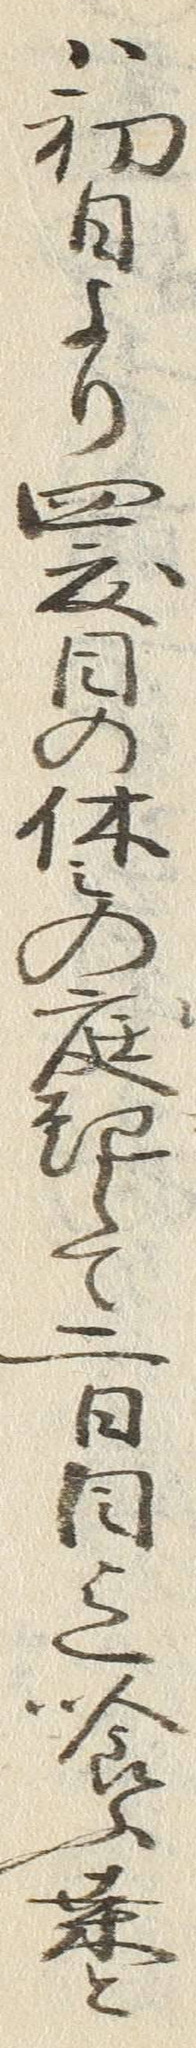は初日より四度目の休みの庭起して二日目迄喰ふ桑と
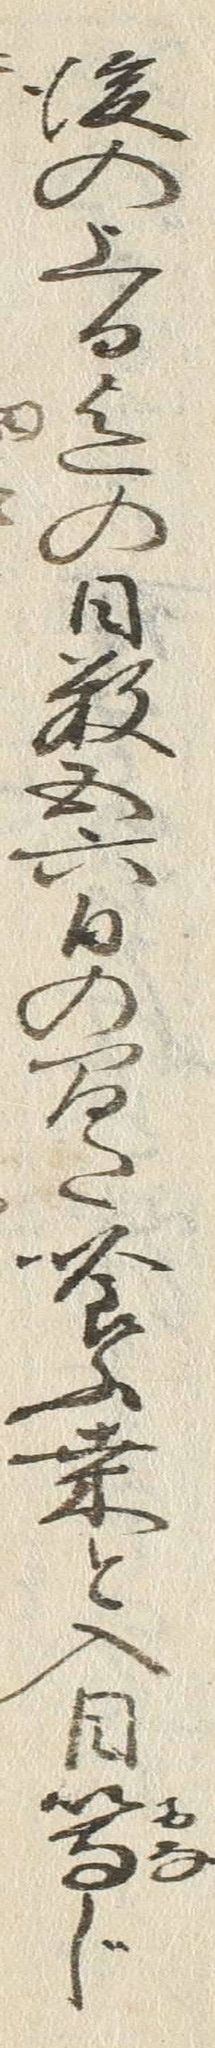後の上る迄の日数五六日の間た喰ふ桑と入目等じ
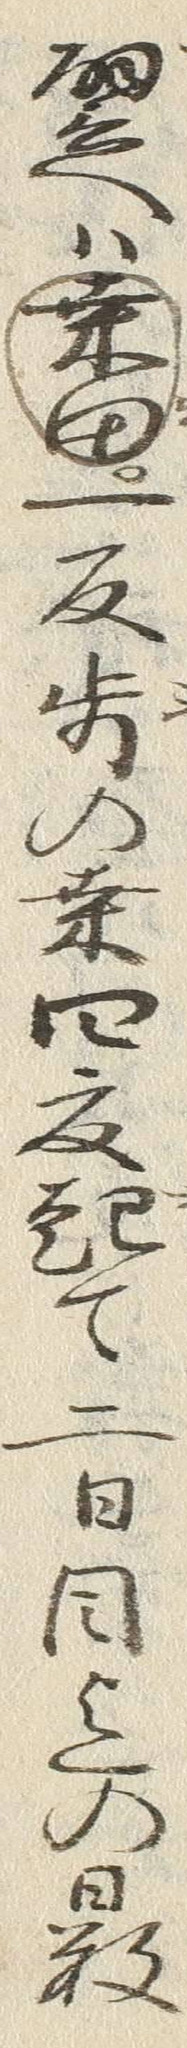譬へは畑一反歩の桑四反起て二日目迄の日数
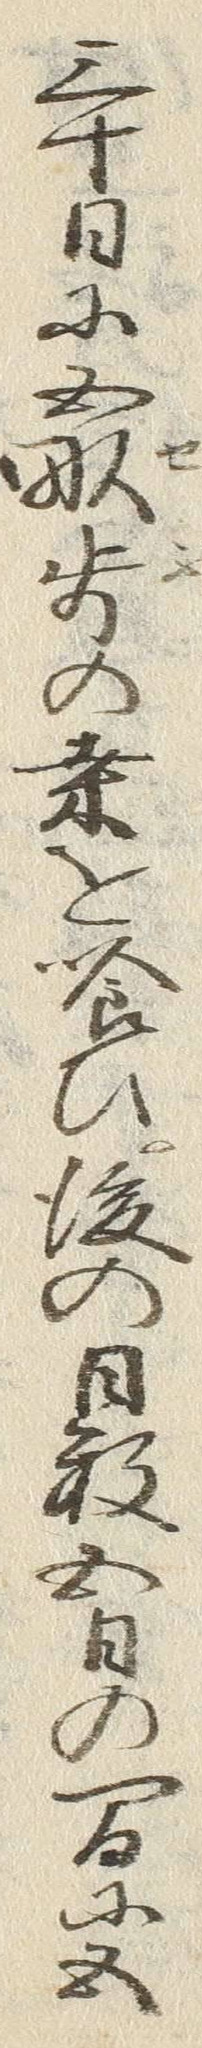三十日尓五畝歩の桑を喰ひ。後の日数五日の間尓五
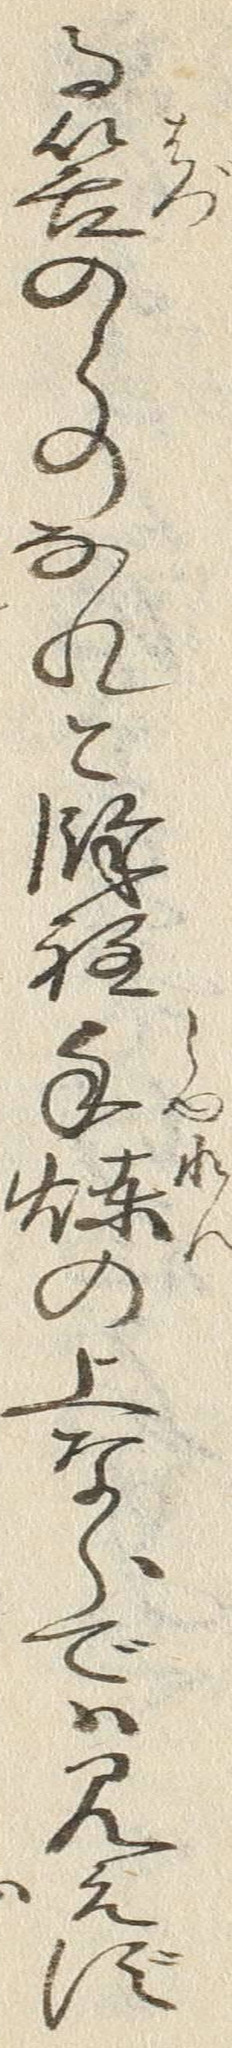知れる筈の事なれと餘程手煉の上ならでは見えず
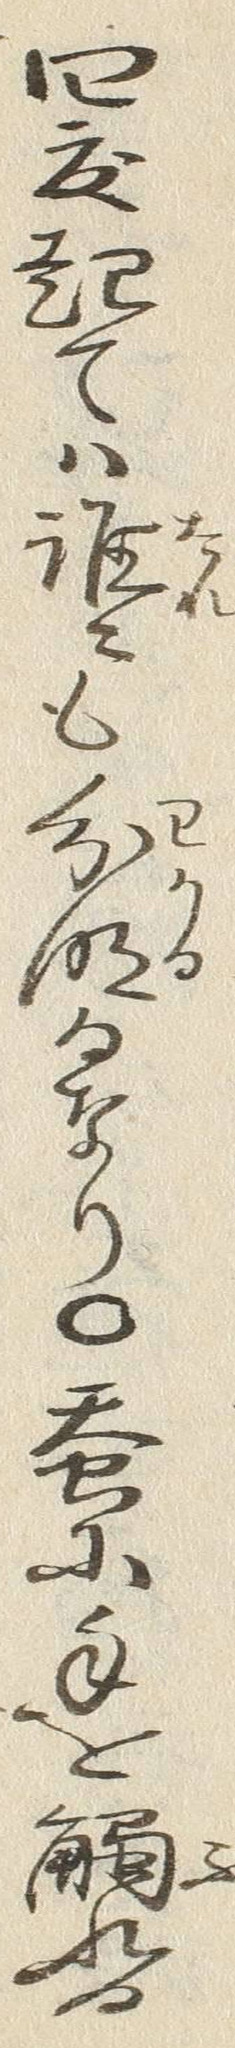四度起ては誰にも分明るなり〇蚕尓手を觸れる
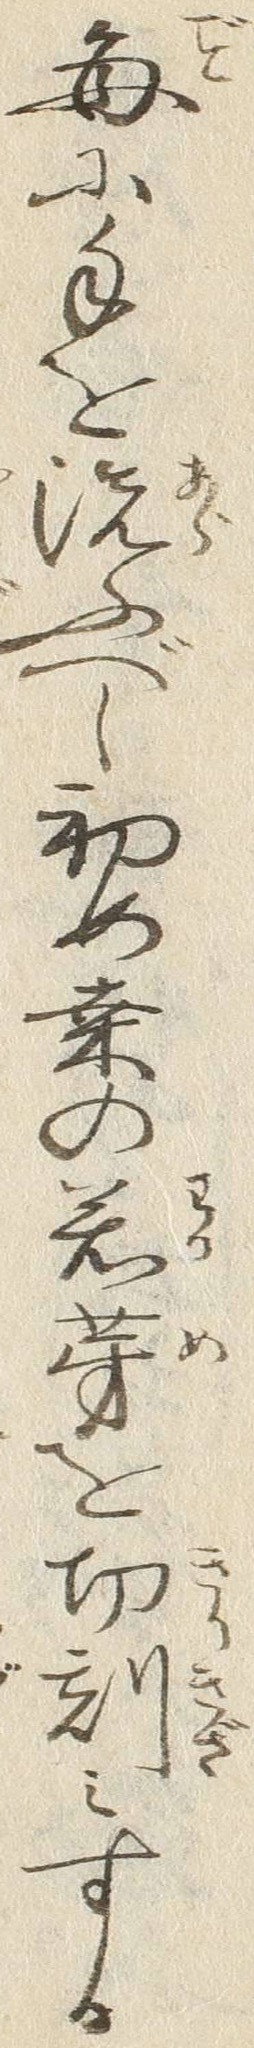毎尓手を洗ふべし初め桑の若芽を切刻みする
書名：養蠶實驗録後編
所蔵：東京大学農学生命科学図書館 国文学研究資料館
